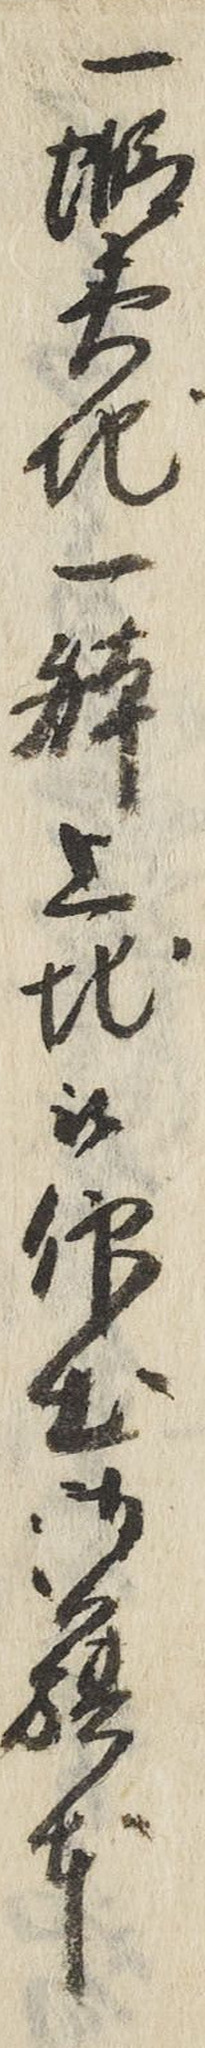一蝦夷地一体上地被仰出御旗本
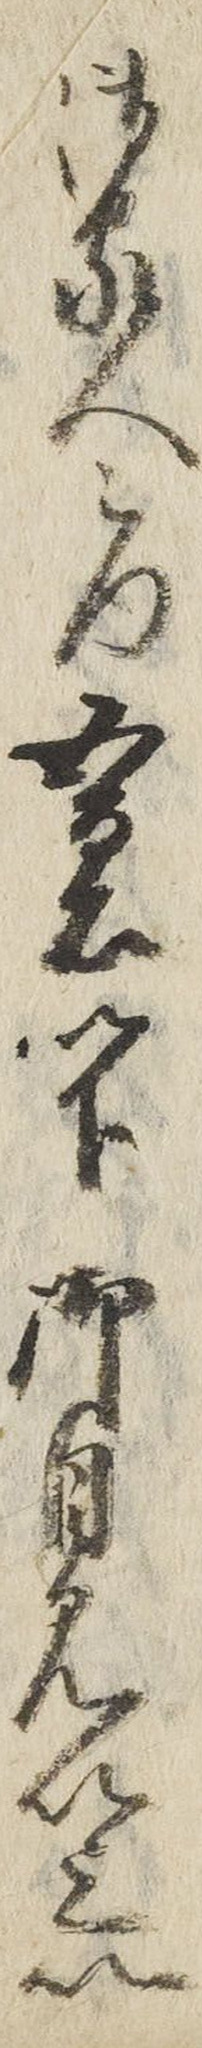御家人之内五百石以下御目見以上以
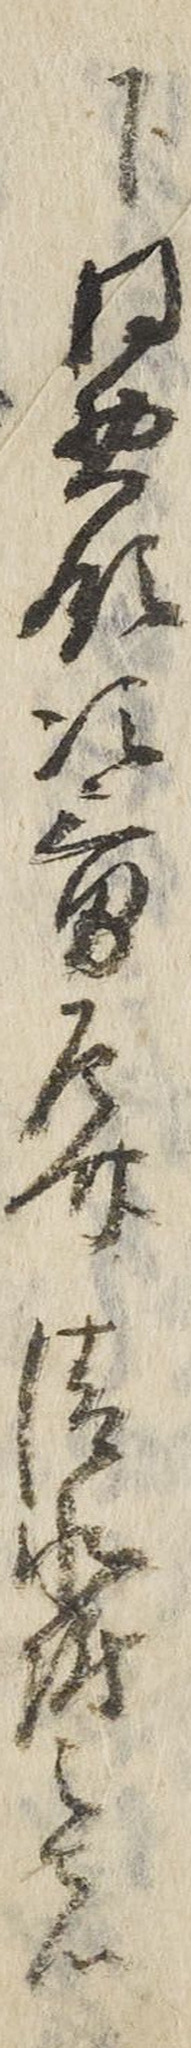下同惣領次三男厄介清水附之者
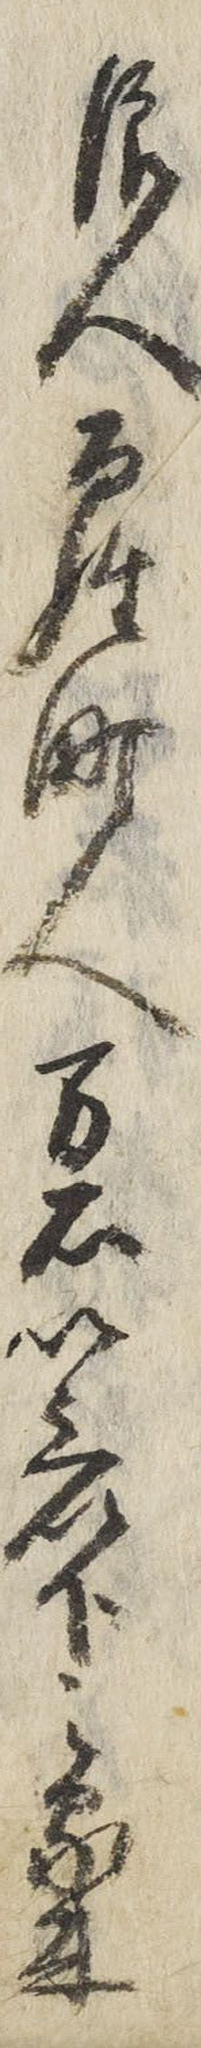浪人百姓町人万石以上以下之家来
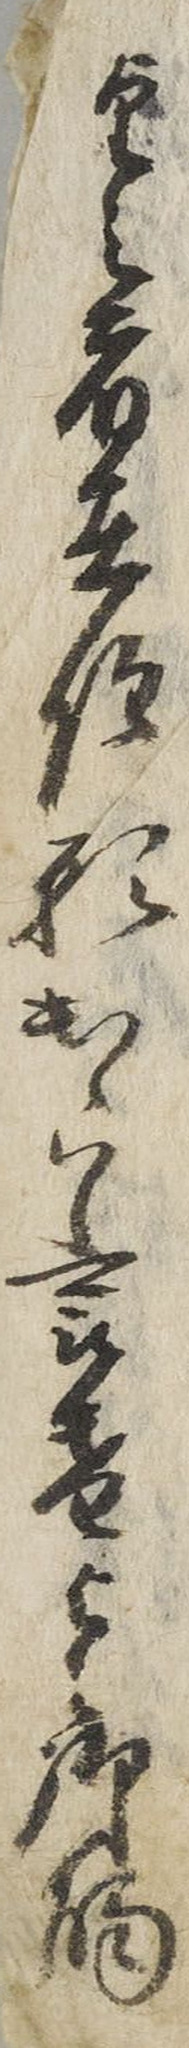望之者在住願出候ハヽ可被替と御触
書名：文政已来異変日記
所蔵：要相談
